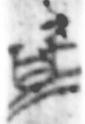爲
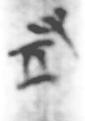○（右）
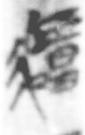驂
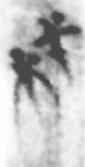杙
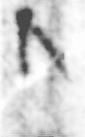人
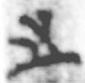之
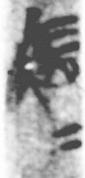駟
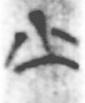少
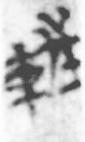○（廣）
